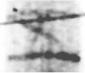五
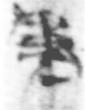秉
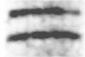二
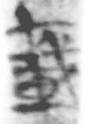載
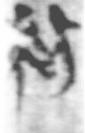紫
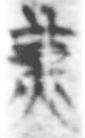黃
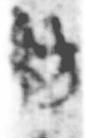紡
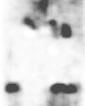之
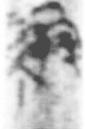綳
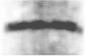一
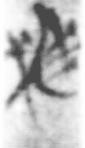○（戟）
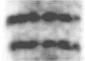二
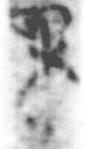果（戈）
